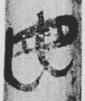母（毋）
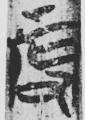辱
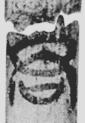君
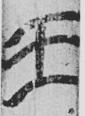王
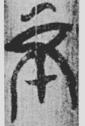不
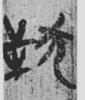○（幸）
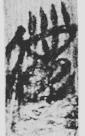○（僕）
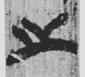之
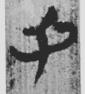父
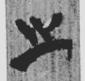之
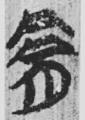骨
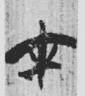才（在）
